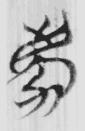{鹿人力}
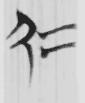𡰥
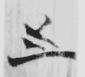之
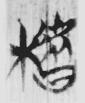{木虍皆}
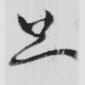也
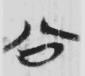公
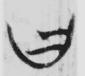曰
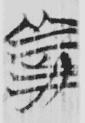義
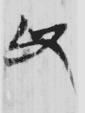父
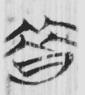昔
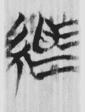{糸馬}
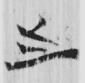之
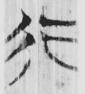行
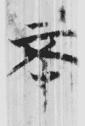不
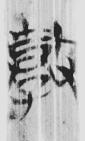{𣪊子}
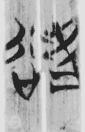欲
